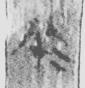八十=
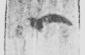一
